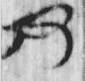尹
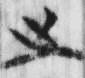之
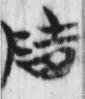○（隋）
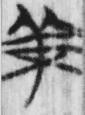样
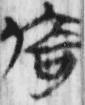倚
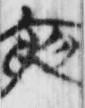寅
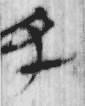丑
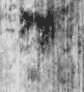人
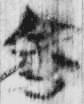舒
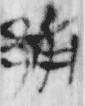郙
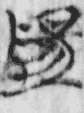陽（陽）
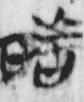暑
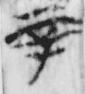辛
